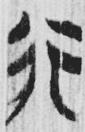行
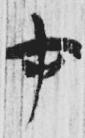才（在）
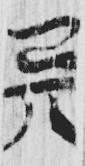己
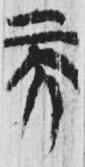而
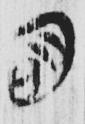名
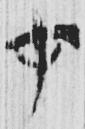才（在）
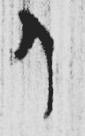人
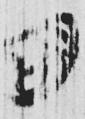名
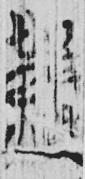難
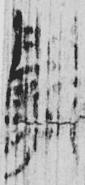靜（爭）
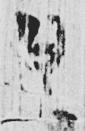也
